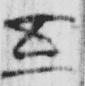五
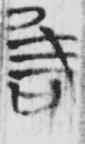唯
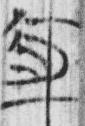宜
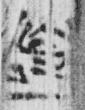道
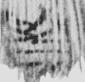爲
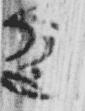近
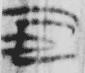𠁩（忠）
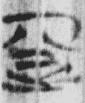亞（惡）
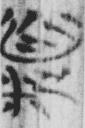頪（類）
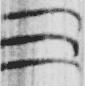三
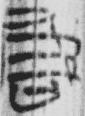唯
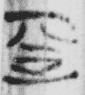亞（惡）
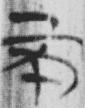不
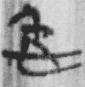○（仁）
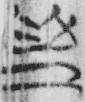爲
